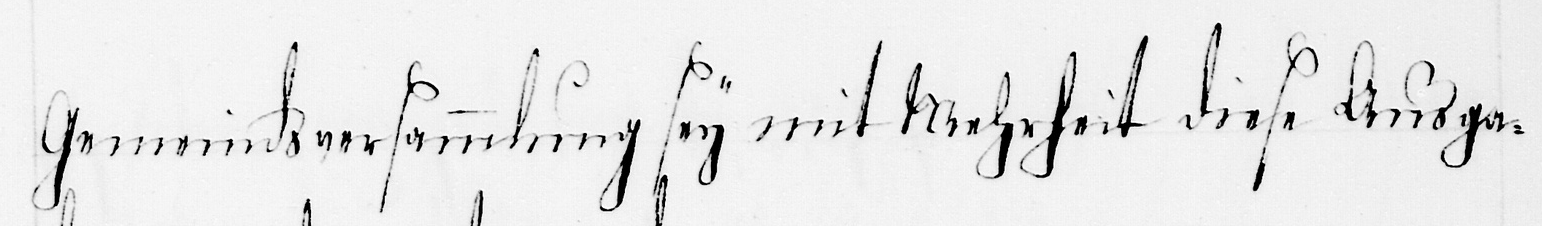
Gemeindsversammlung sey mit Mehrheit diese Ausga¬
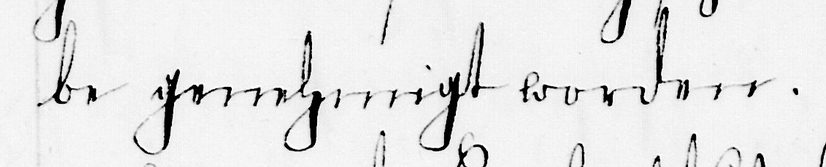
ben genehmigt worden.
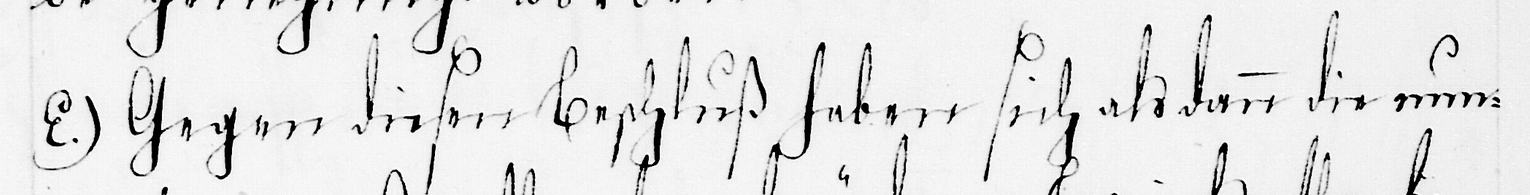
E.) Gegen diesen Beschluß haben sich als dann die nun¬
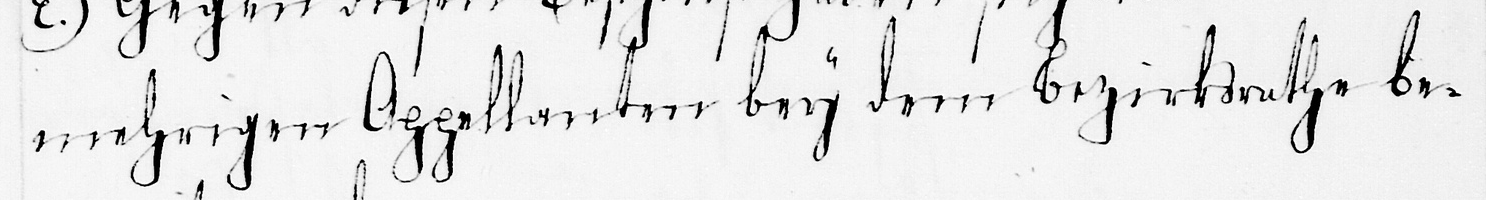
mehrigen Appellanten bey dem Bezirksrathe be¬
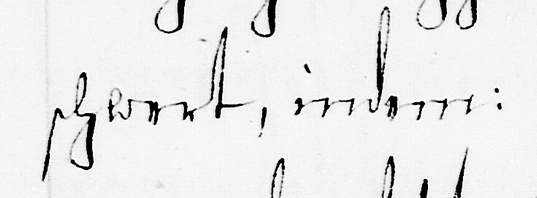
schwert, indem:
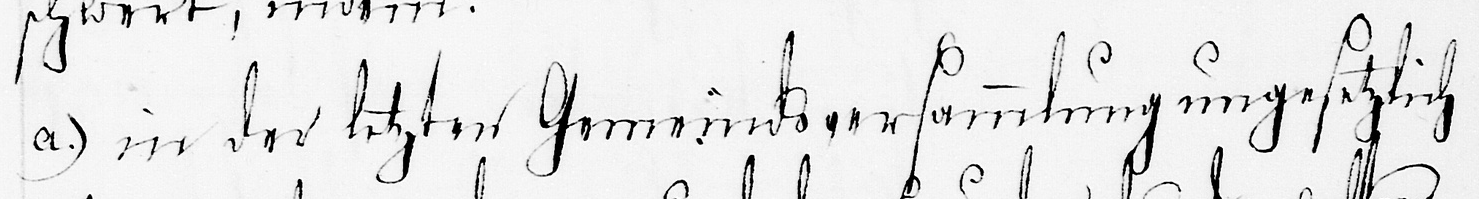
a.) in der letzten Gemeindsversammlung ungesetzlich
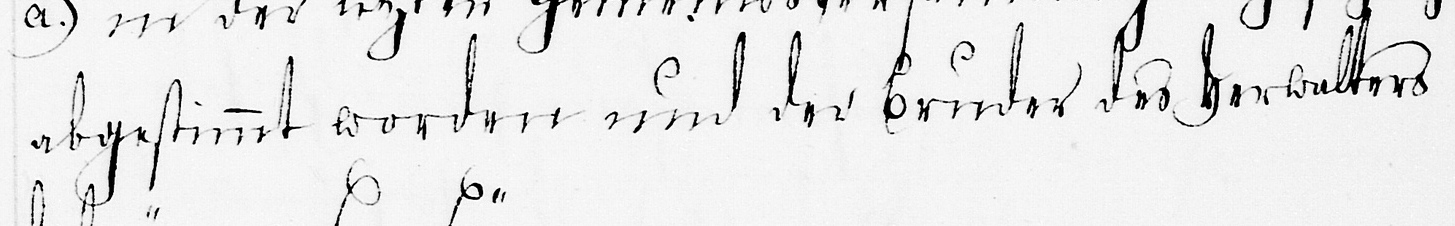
abgestimmt worden und der Bruder des Verwalters
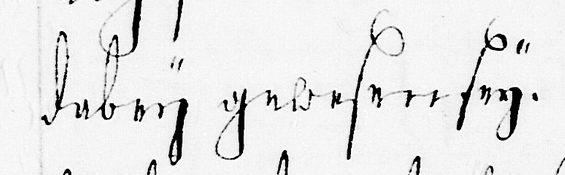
dabey gewesen sey.
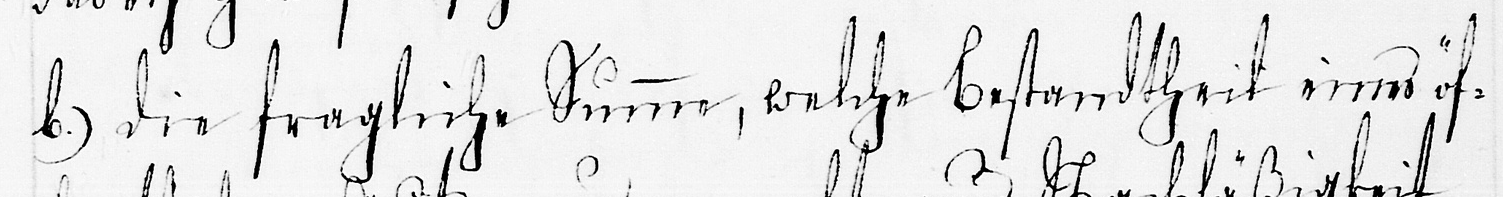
b.) die fragliche Summe, welche Bestandtheil eines öf¬
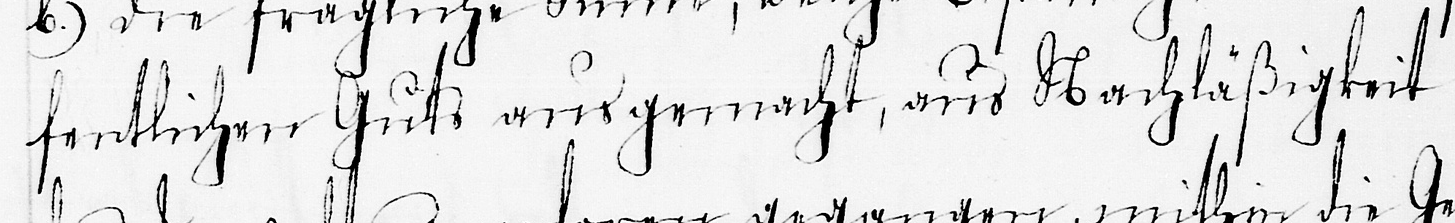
fentlichen Guts ausgemacht, aus Nachläßigkeit
